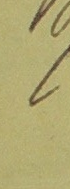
--
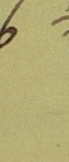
--
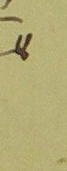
--
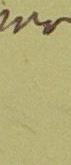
--
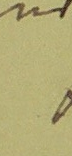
--
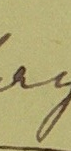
--
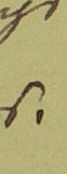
--
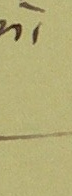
82
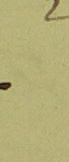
--
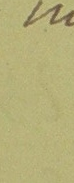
--
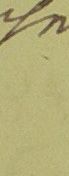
30
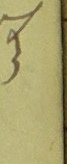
40
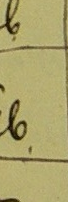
102
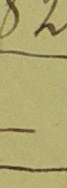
40
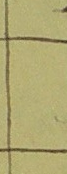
16
